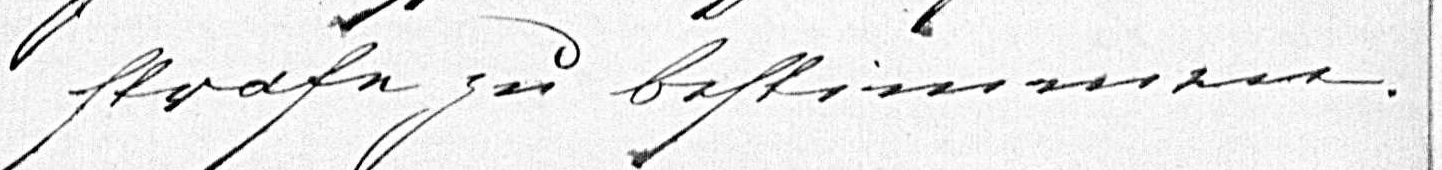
strafe zu bestimmen
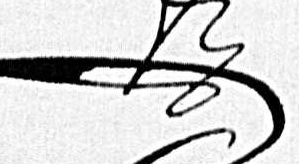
FJ
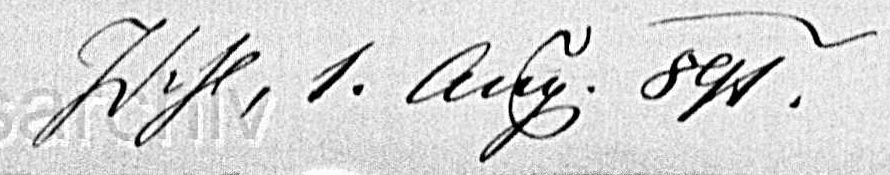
xx Wehl, 1. Aug. 891.
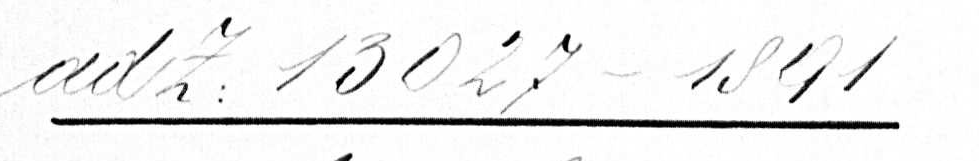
adz: 13027 - 1891/
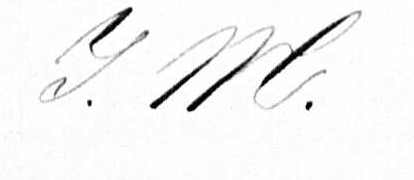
J. M.
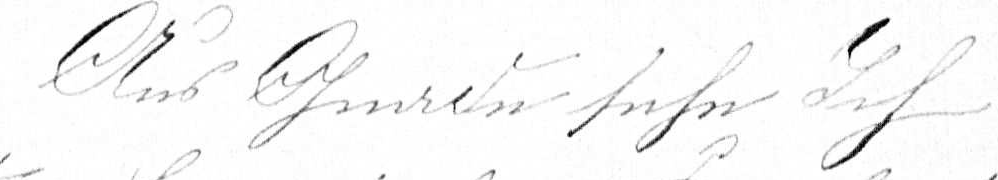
Aus Gnade sehe Ich
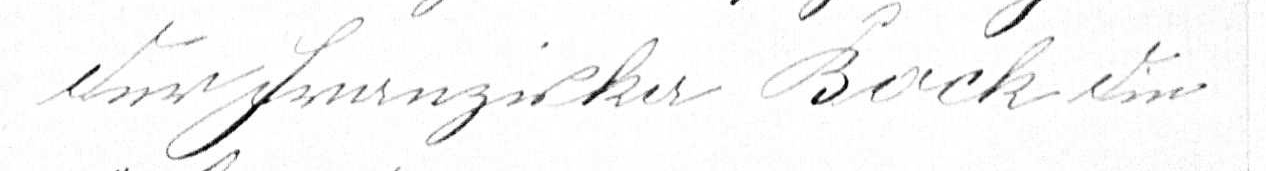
der Franziska Bock die
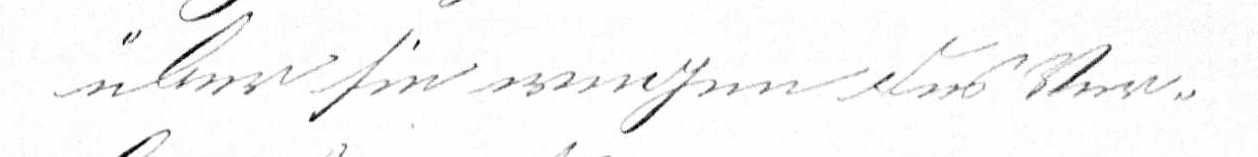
über sie wegen das Ver¬
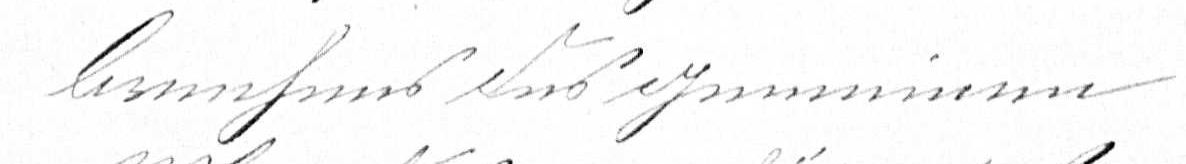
brechens das Gemeinen
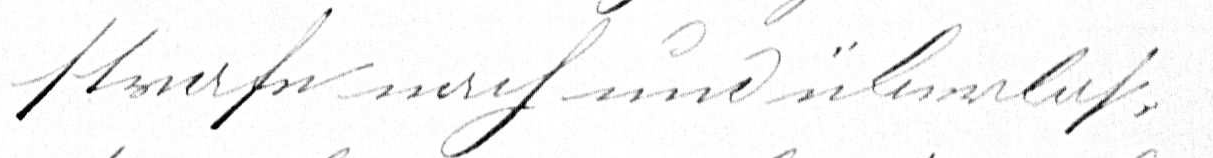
strafe nach und überlas¬
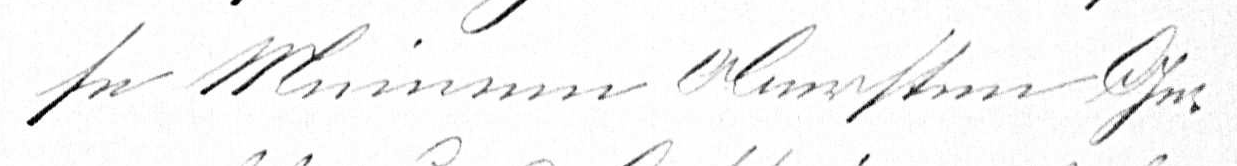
se Meinem Obersten Ge¬
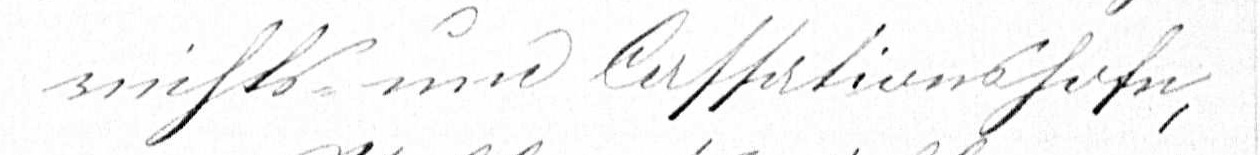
richts und Cassationshofe,
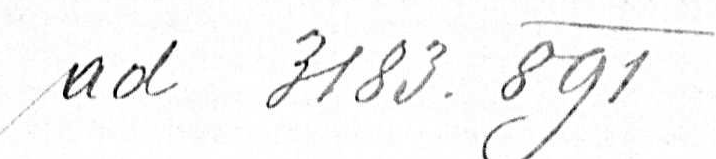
ad. 3183. 891
